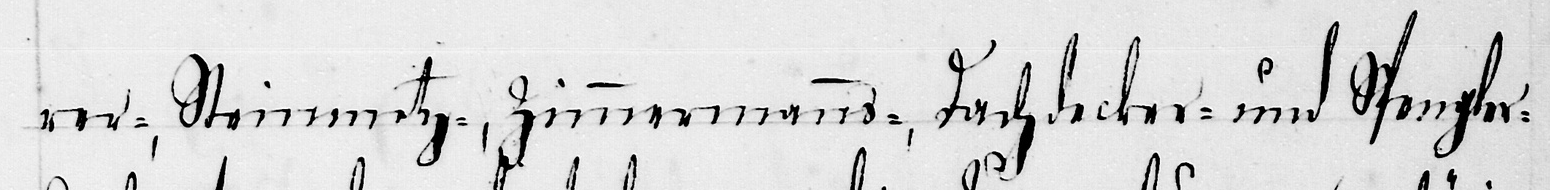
rer-, Steinmetz-, Zimmermanns-, Dachdecker- und Spengle¬
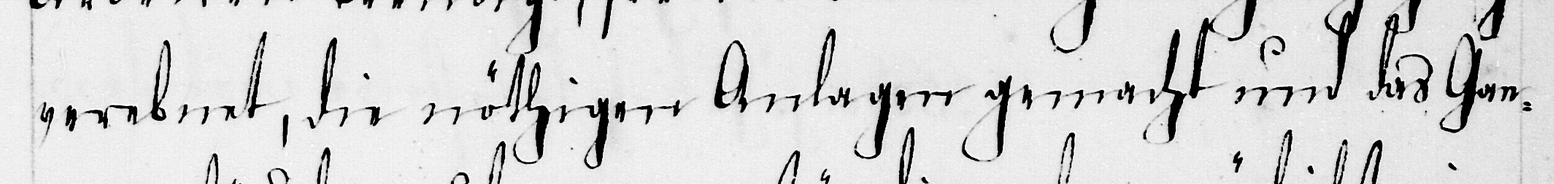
verebnet, die nöthigen Anlagen gemacht und das Gan¬
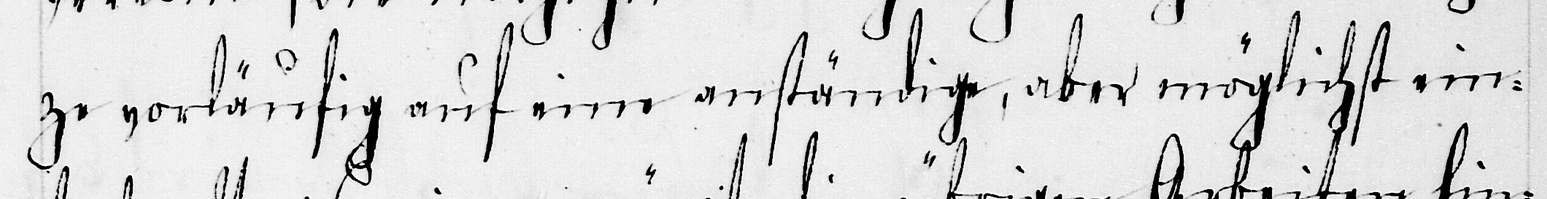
ze vorläufig auf eine anständige, aber möglichst ein¬
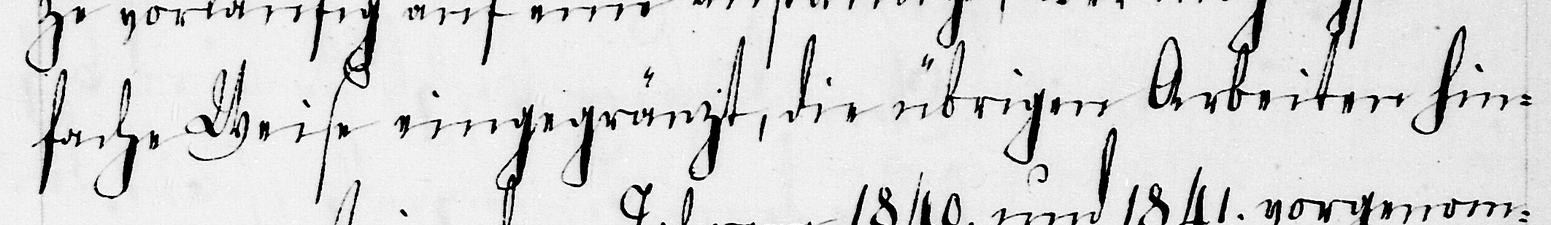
fache Weise eingegränzt, die übrigen Arbeiten hin¬
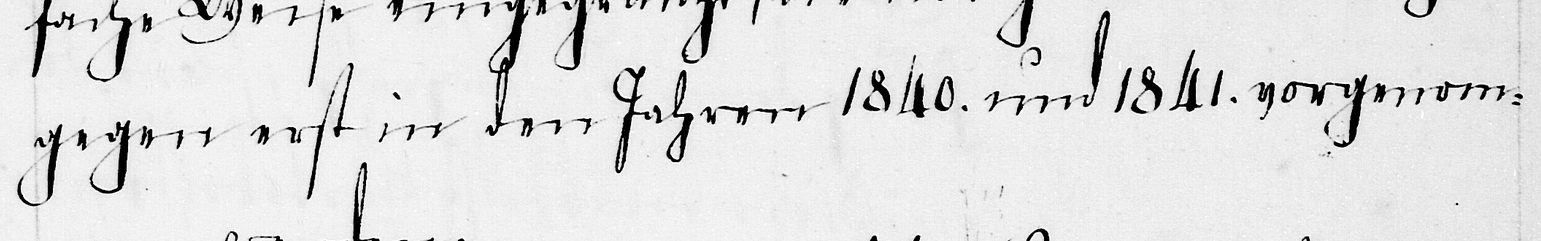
gegen erst in den Jahren 1840. und 1841. vorgenom¬
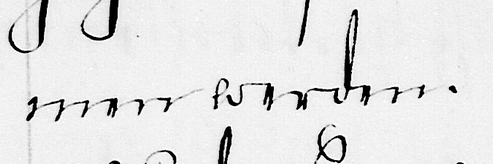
men werden.
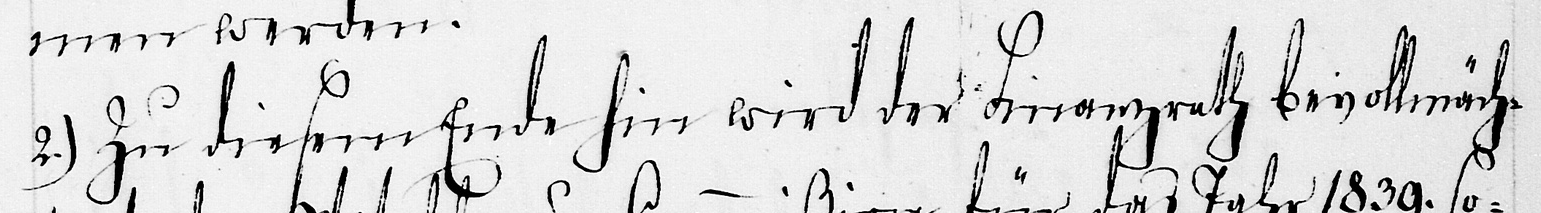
2.) Zu diesem Ende hin wird der Finanzrath bevollmäc¬
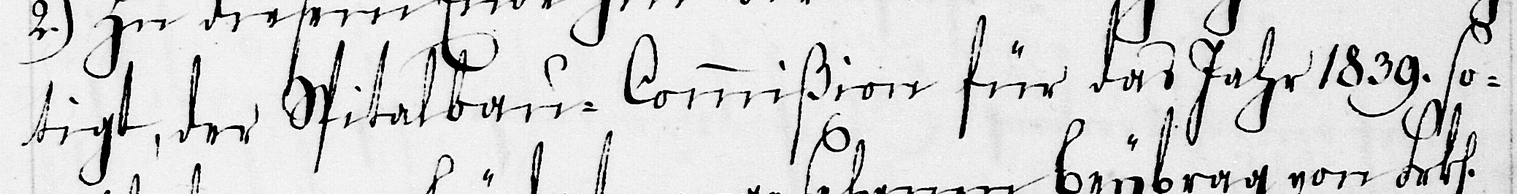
htigt, der Spitalbau-Commißion für das Jahr 1839. s¬
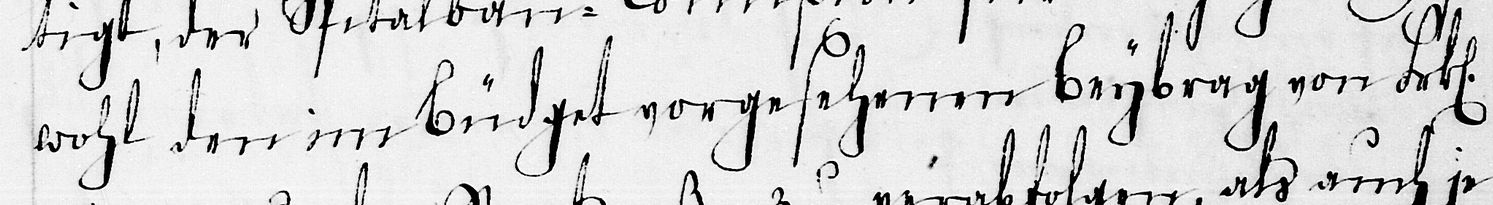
owohl den im Büdget vorgesehenen Beytrag von Fr¬
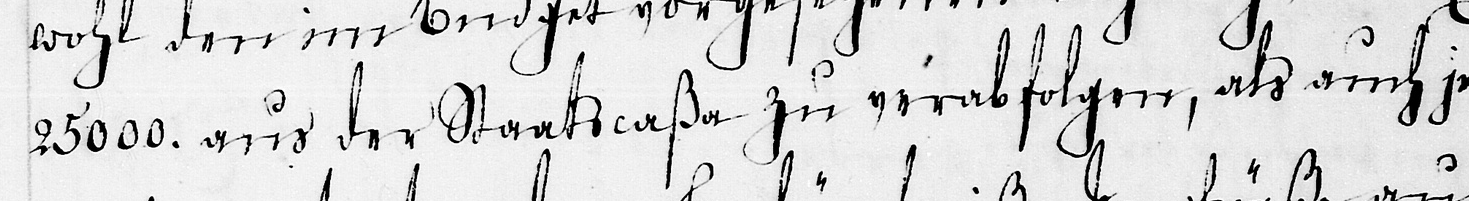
25 000. aus der Staatscaßa zu verabfolgen, als auch
